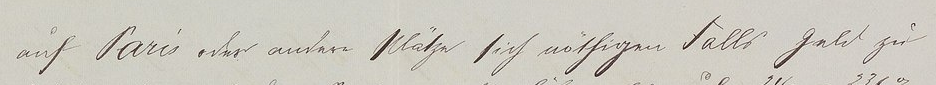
auf Paris oder andere Plätze sich nöthigen Falls Geld zu
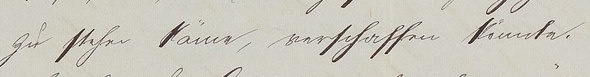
zu stehen käme, verschaffen könnte.
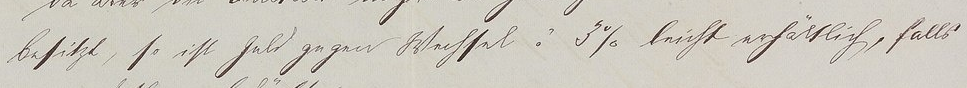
besitzt, so ist Geld gegen Wechsel a 3% leicht erhältlich, falls
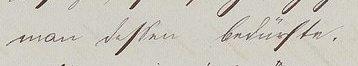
man deßen bedürfte.
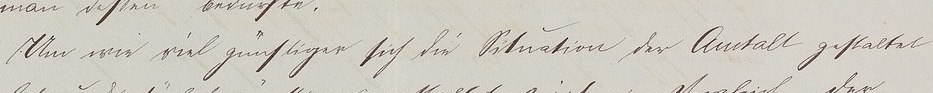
Um wie viel günstiger sich die Situation der Anstalt gestaltet
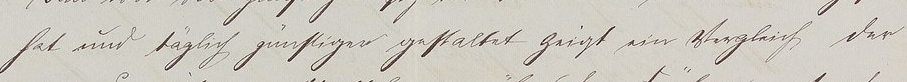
hat und täglich günstiger gestaltet zeigt ein Vergleich der
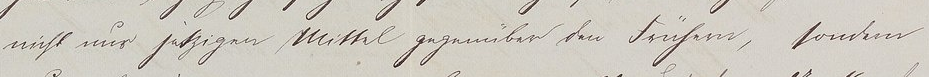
nicht nur jetzigen Mittel gegenüber den Frühern, sondern
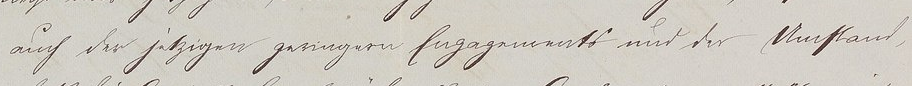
auch des jetzigen geringern Engagements und der Umstand,
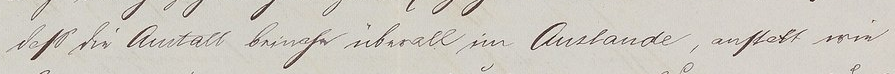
daß die Anstalt beinahe überall im Auslande, anstatt wie
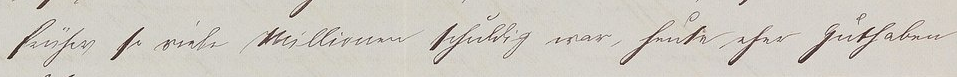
früher so viele Millionen schuldig war, heute eher Guthaben
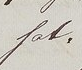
hat.
